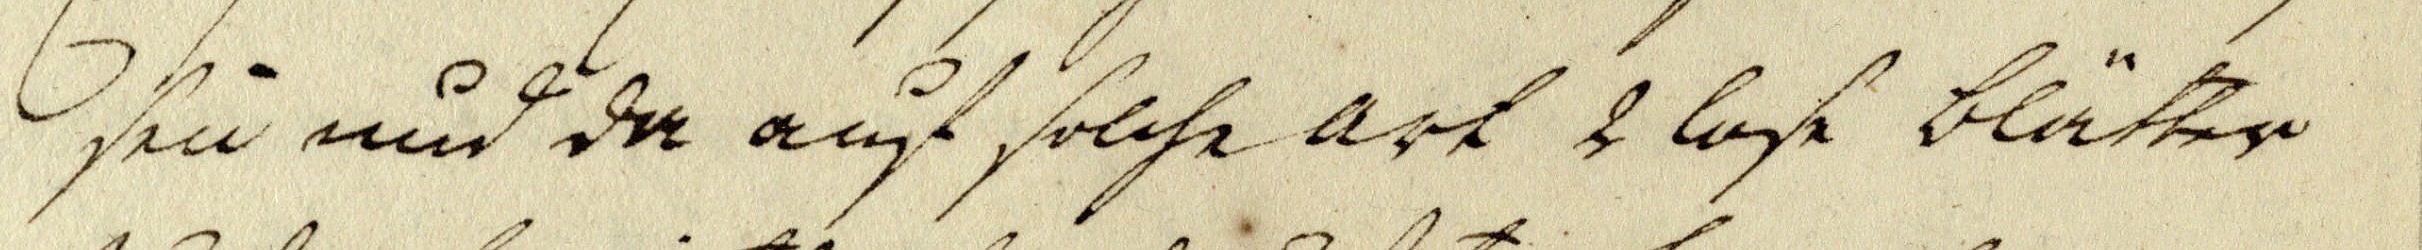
sen und da auf solche Art 2 lose Blätter
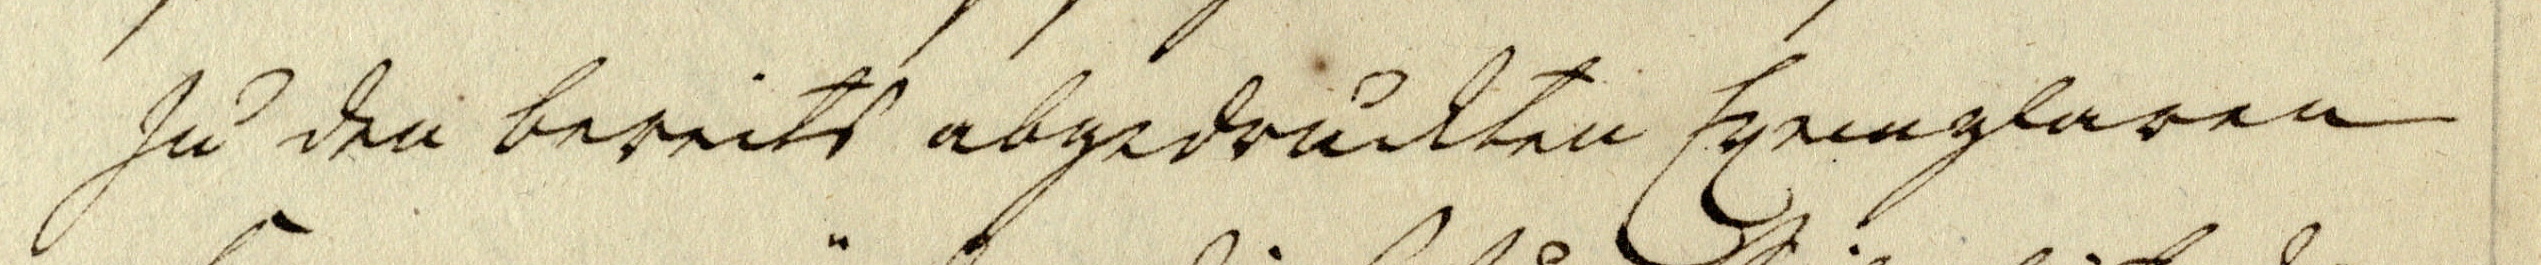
zu den bereits abgedruckten Exemplaren
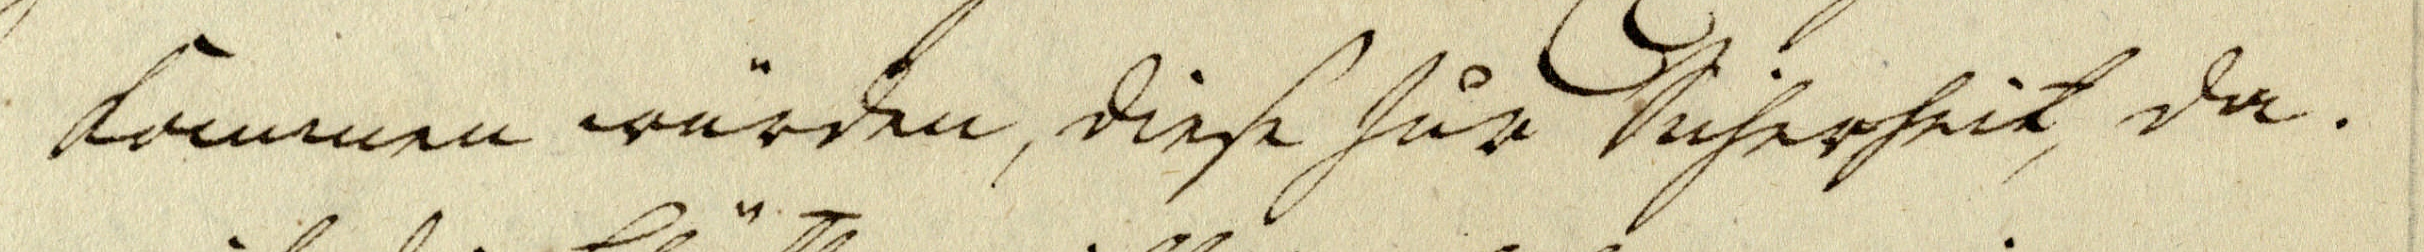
kommen würden, diese zur Sicherheit, da¬
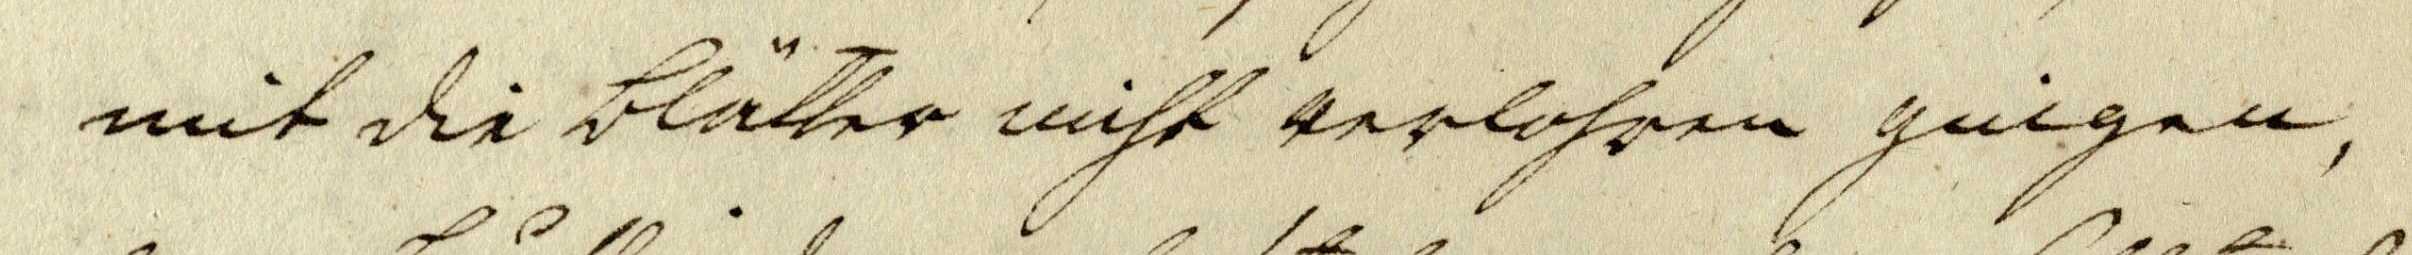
mit die Blätter nicht verlohren gingen,
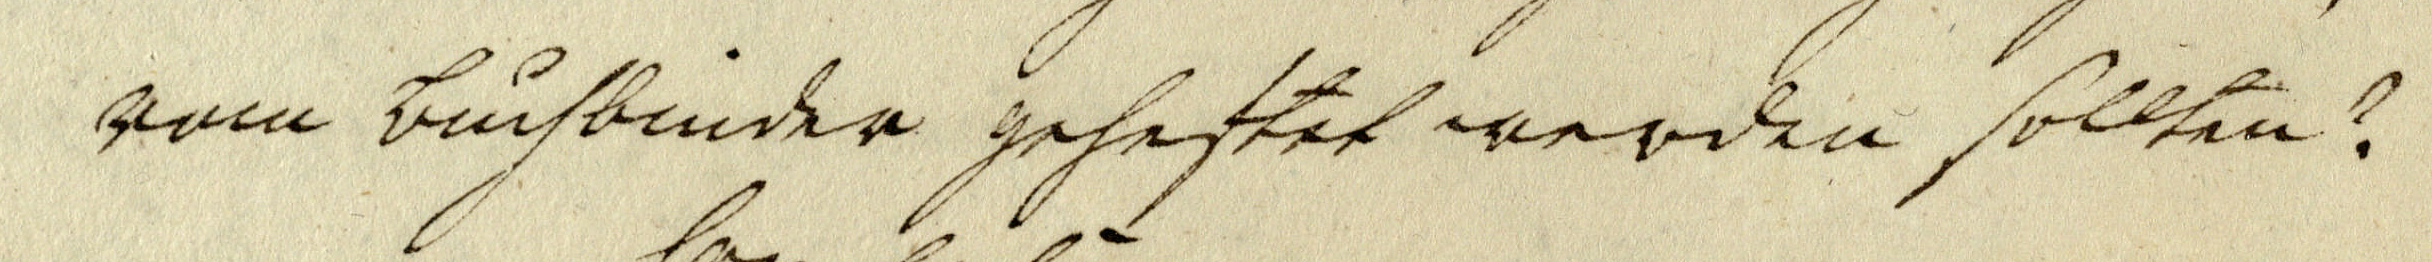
vom Buchbinder geheftet werden sollten?
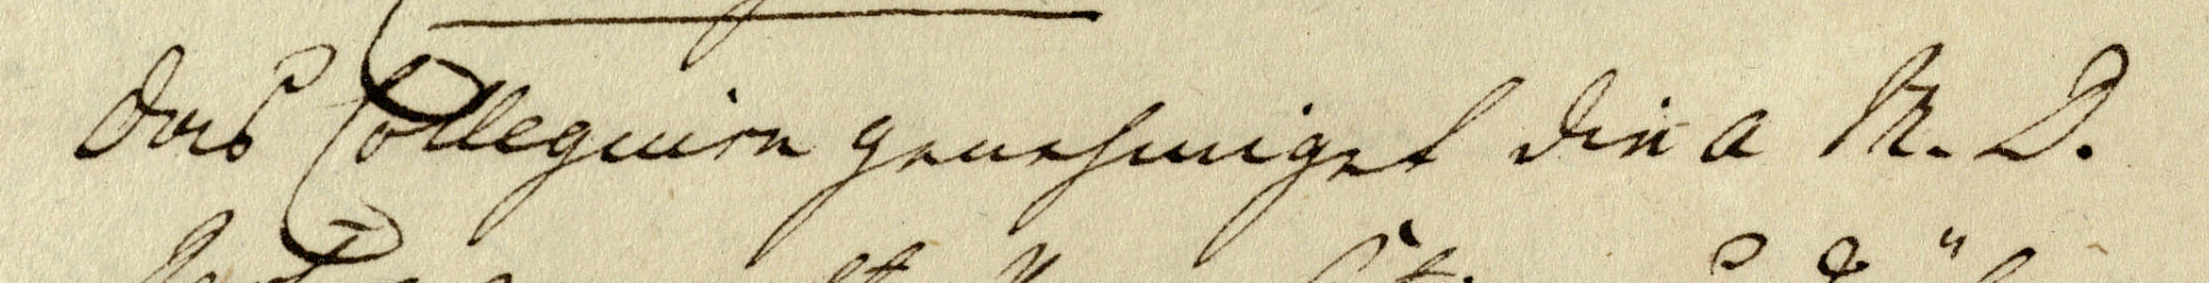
Das Collegium genehmiget die a M. D.
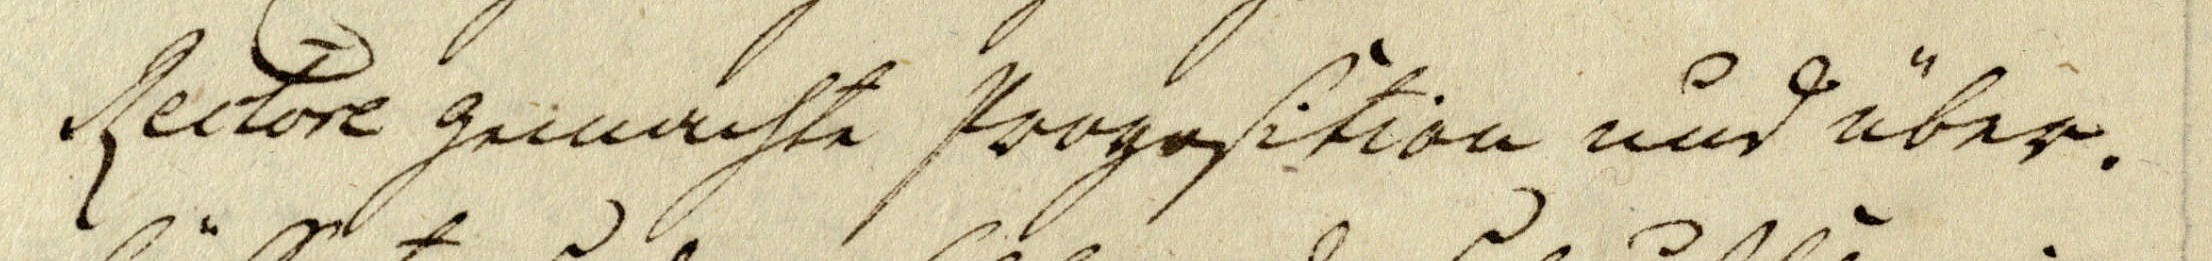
Rectore gemachte Proposition und über¬
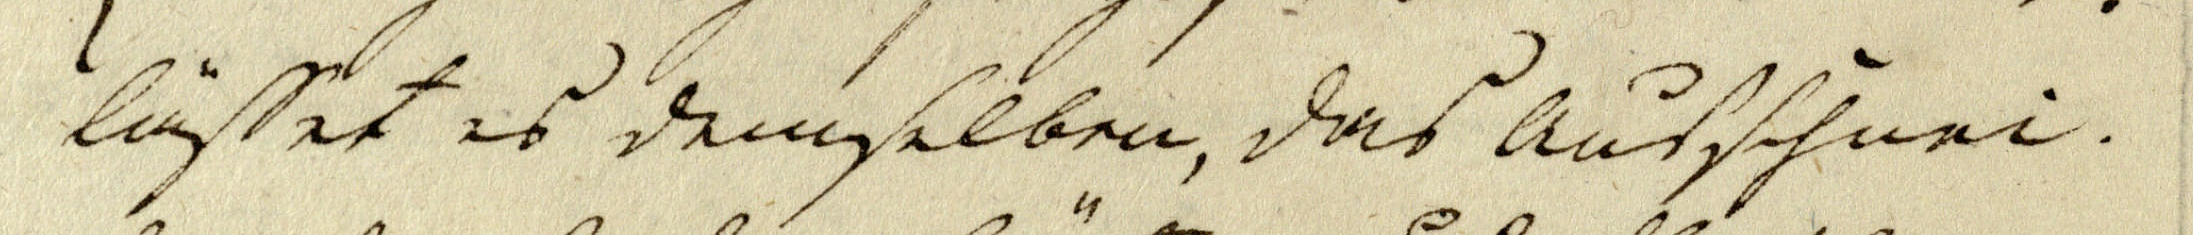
lässet es demselben, das Ausschnei¬
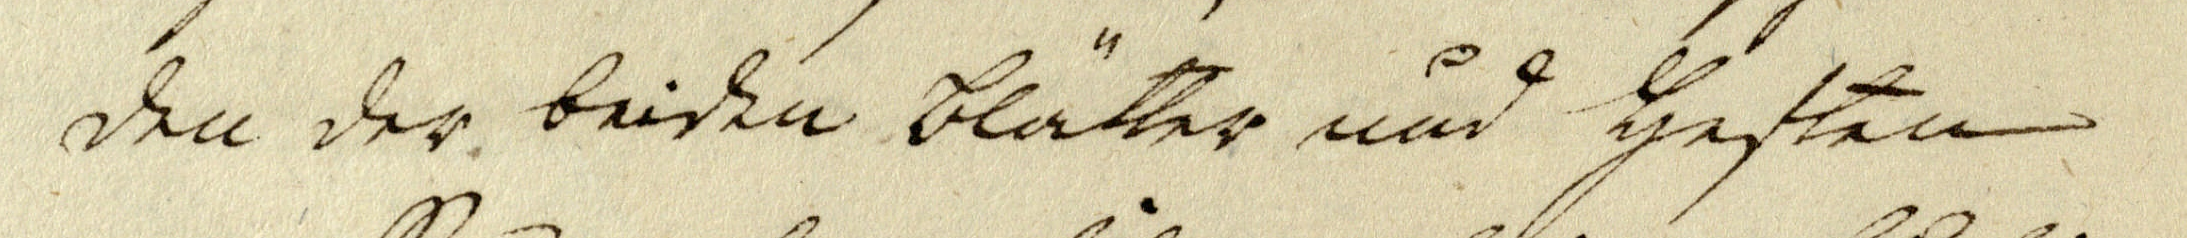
den der beiden Blätter und Heften
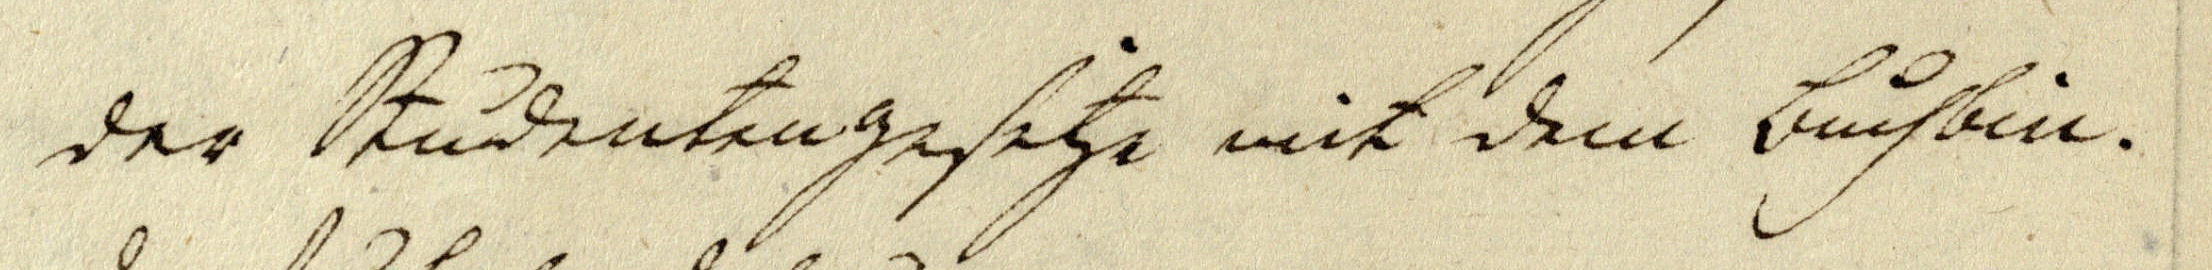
der Studentengesetze mit dem Buchbin¬
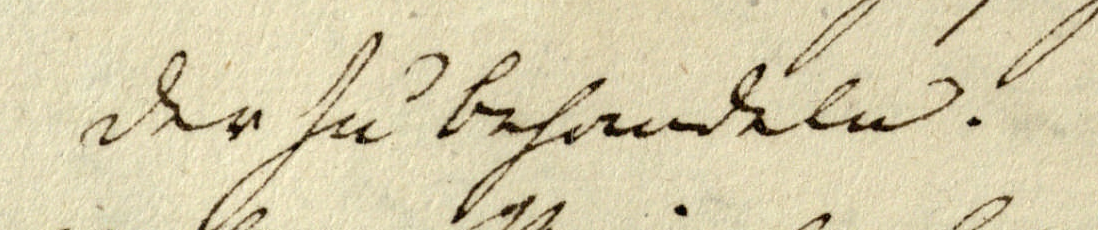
der zu behandeln.
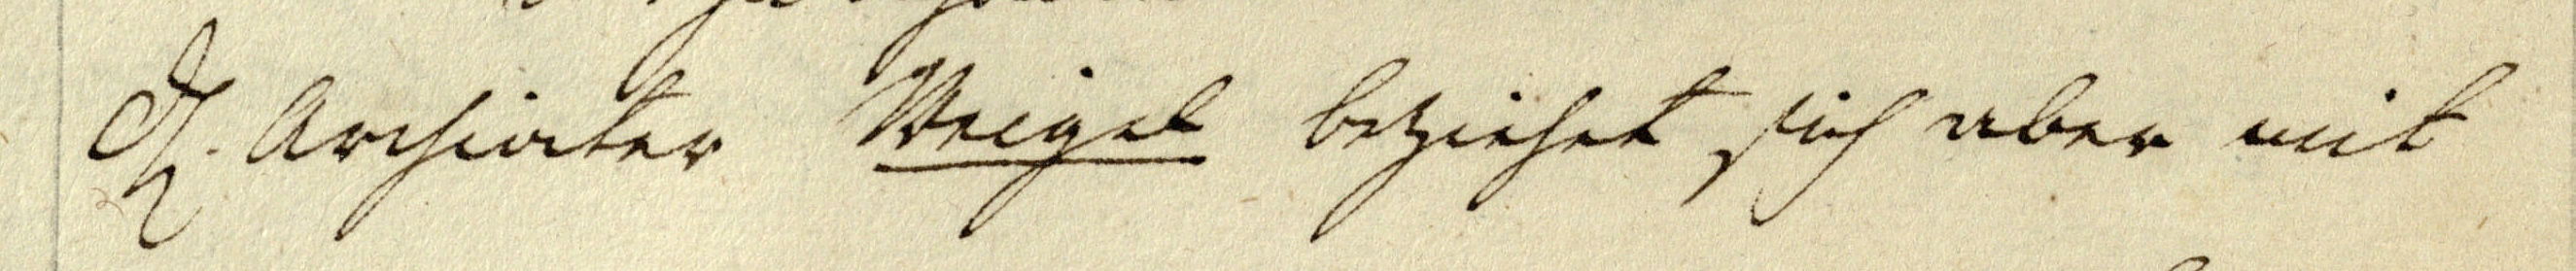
dh. Archiater Weigel beziehet sich aber mit
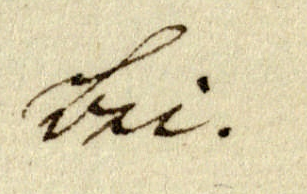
Bei
